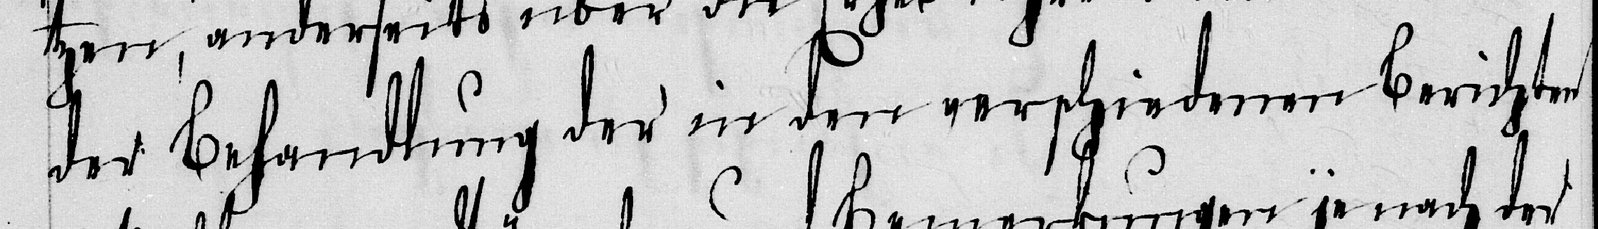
der Behandlung der in den verschiedenen Berichten
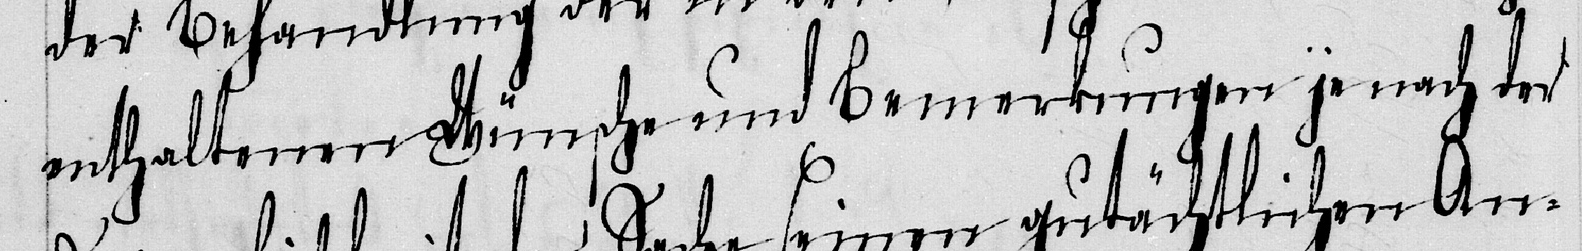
enthaltenen Wünsche und Bemerkungen je nach der
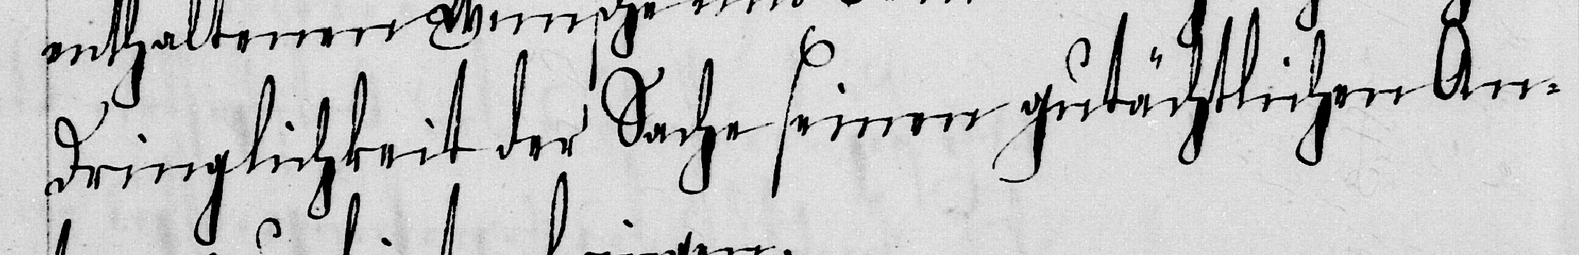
Dringlichkeit der Sache seinen gutächtlichen An¬
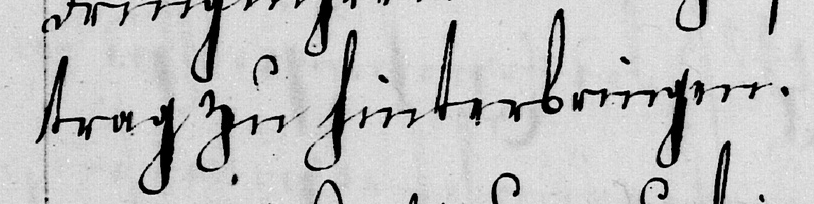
trag zu hinterbringen.
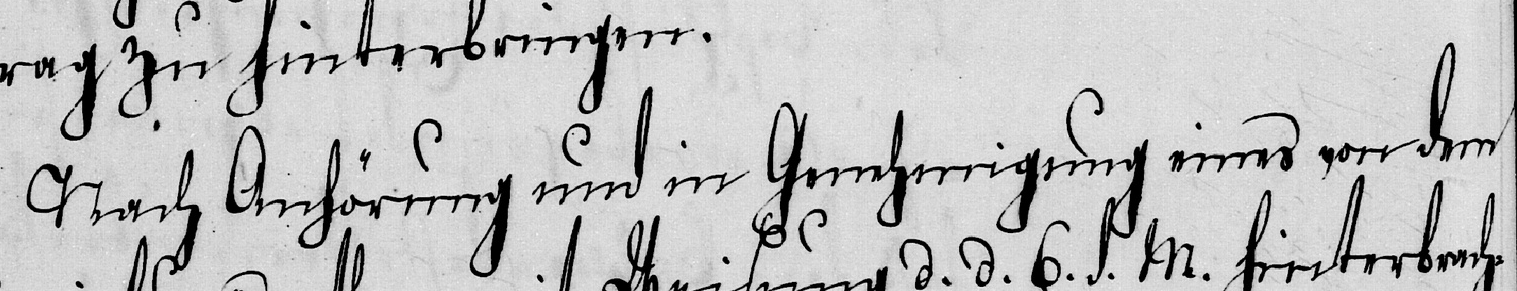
Nach Anhörung und in Genehmigung eines von dem
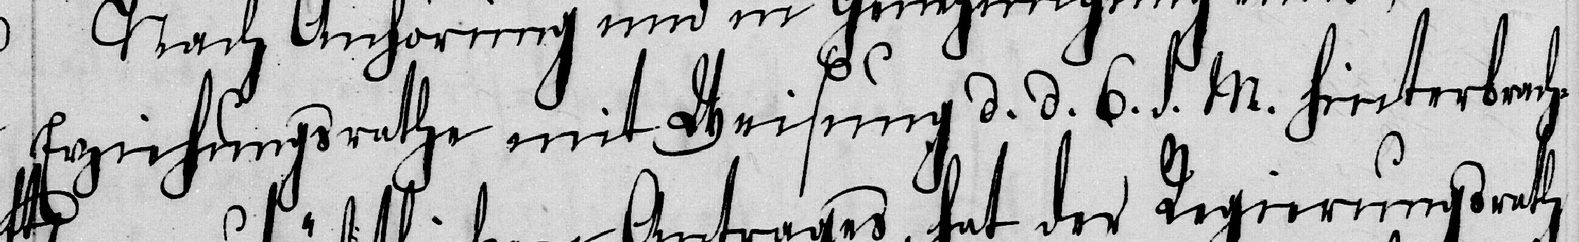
Erziehungsrathe mit Weisung d. d. 6. d. M. hinterbrac¬
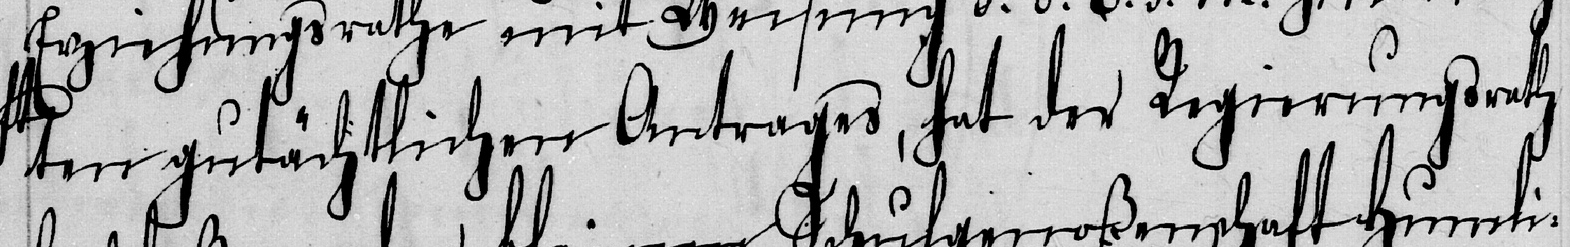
hten gutächtlichen Antrags, hat der Regierungsrath
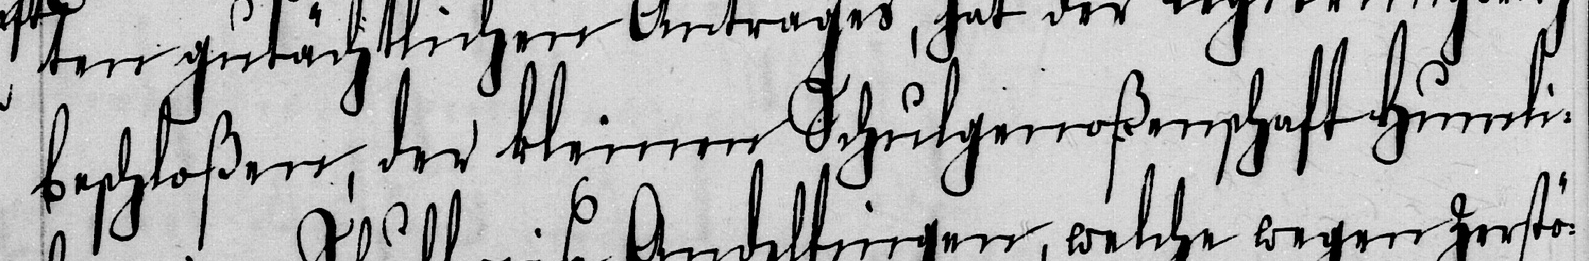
beschloßen, der kleinen Schulgenoßenschaft Humli¬
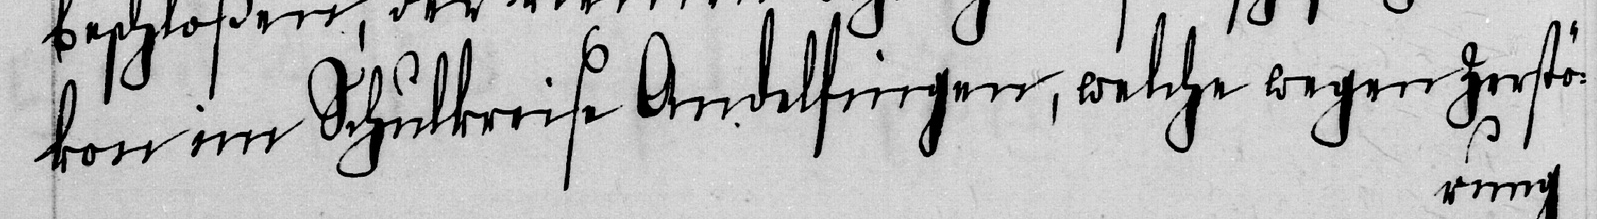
kon im Schulkreis Andelfingen, welche wegen Zerstö-
